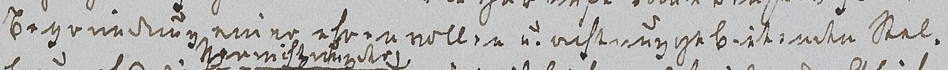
Begründung einer ehrenvollen u. achtungsgebietenden Stel-
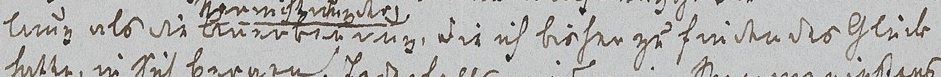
lung als die Vernichtung der Anerkennung, die ich bisher zu finden das Glück
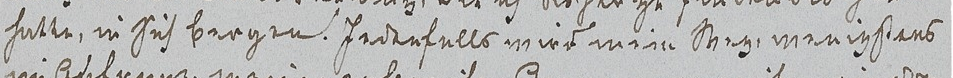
hatte, in sich bergen. Jedenfalls wird mein Weg, wenigstens
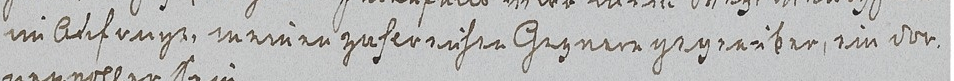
im Anfange, meinen zahlreichen Gegnern gegenüber, ein dor-
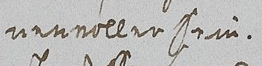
nenvoller sein.
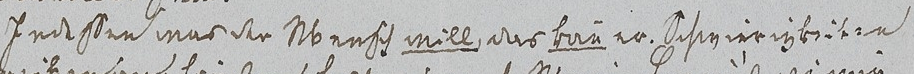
Indessen was der Mensch will, das kann er. Schwierigkeiten
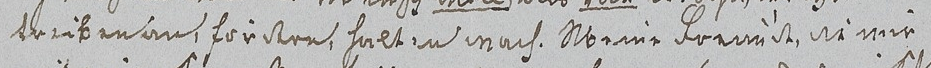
treiben an, fördern, halten wach. Meine Freunde, die mir
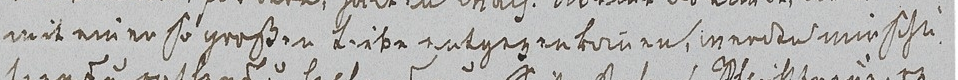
mit einer so großen Liebe entgegenkommen, werden mir schü-
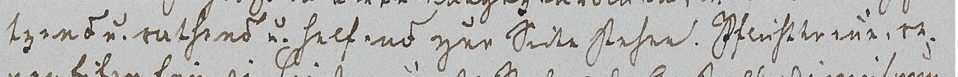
tzend u. rathend u. helfend zur Seite stehen. Pflichttreue, re-
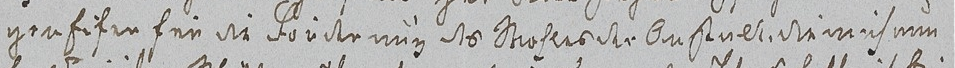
ger Eifer für die Förderung des Wohles der Anstalt, die mich nun
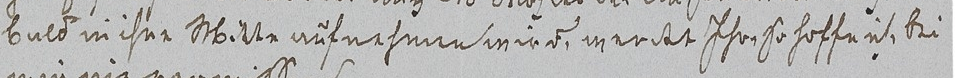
bald in ihre Mitte aufnehmen wird, werdet Ihr, so hoffe ich, bei
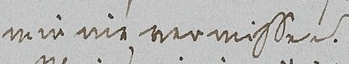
mir nie vermissen.
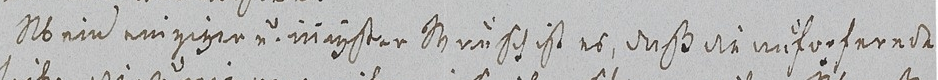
Mein einziger u. innigster Wunsch ist es, daß die aufopfernde
